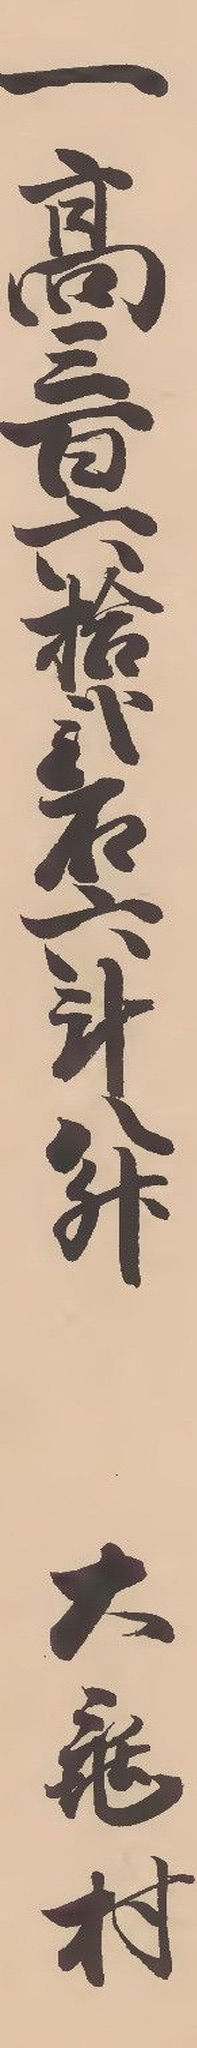一高三百六拾弐石六斗八升大亀村

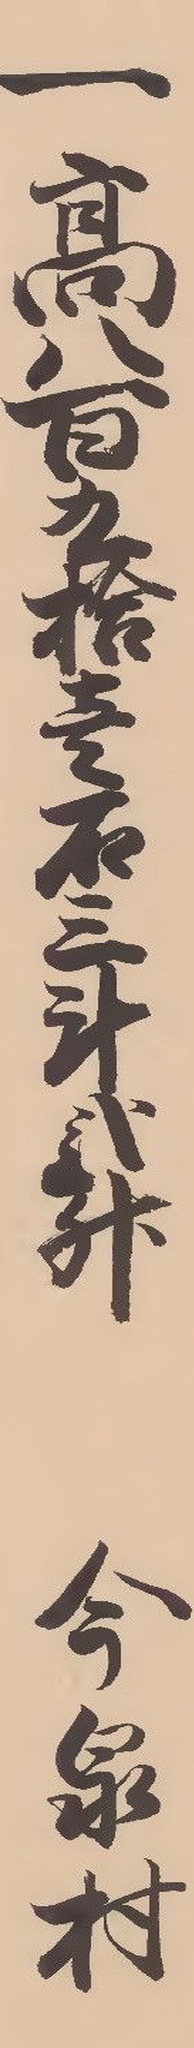一高八百九拾壱石三斗弐升今泉村
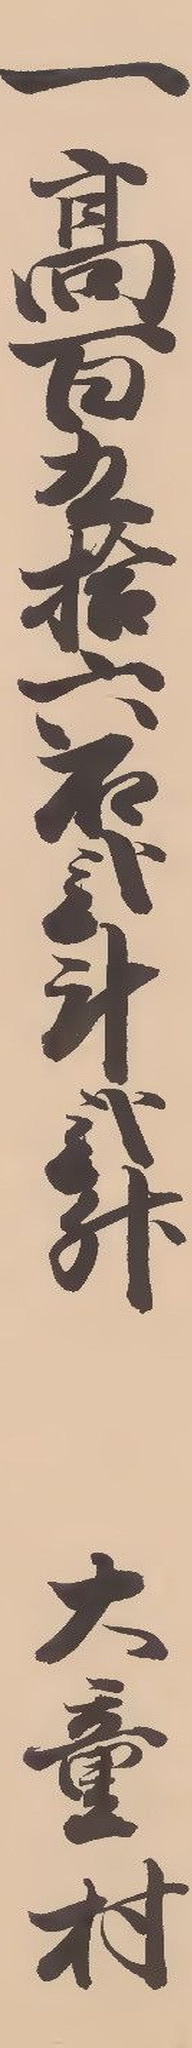一高百九拾六石弐斗弐升大童村
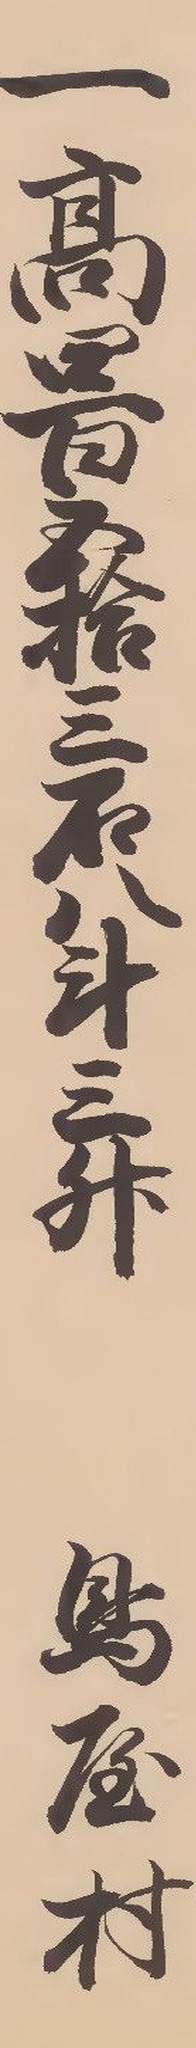一高四百五拾三石八斗三升鳥屋村
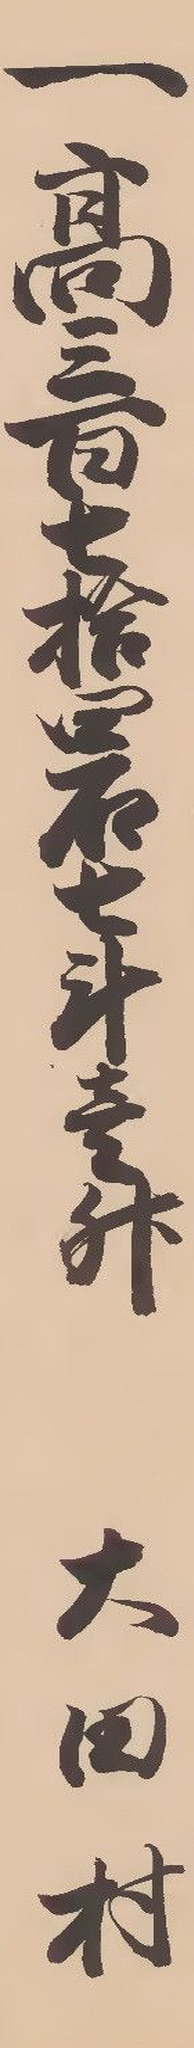一高三百七拾四石七斗壱升大田村
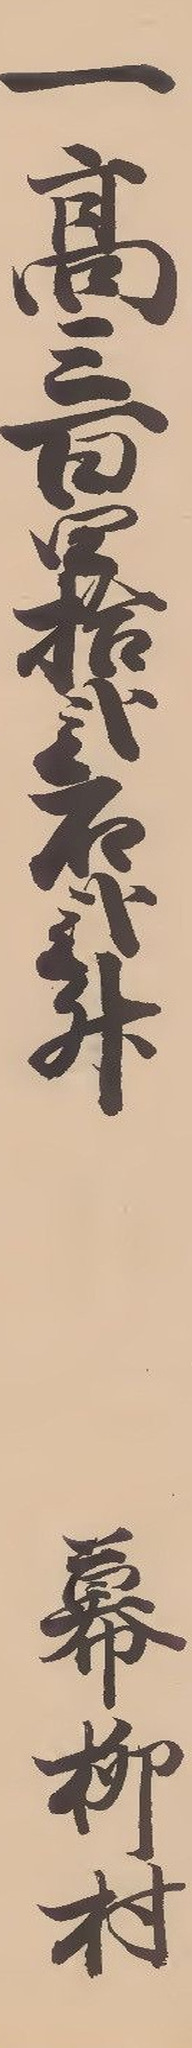一高三百四拾弐石弐升幕柳村
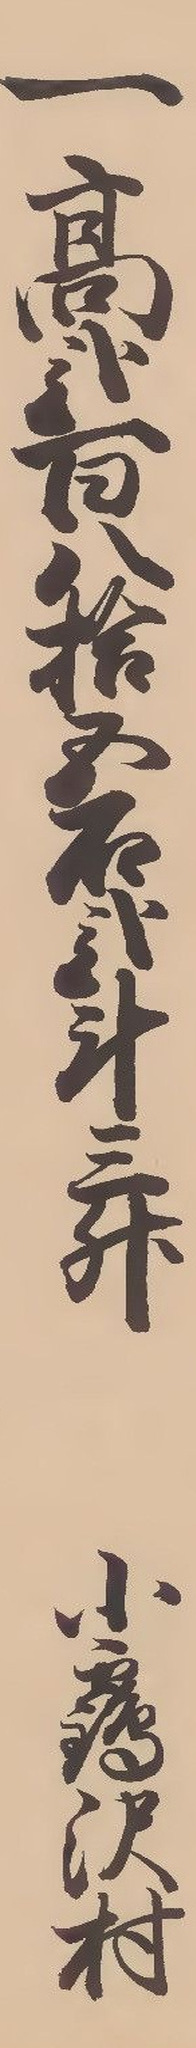一高弐百八拾五石弐斗三升小鶴沢村
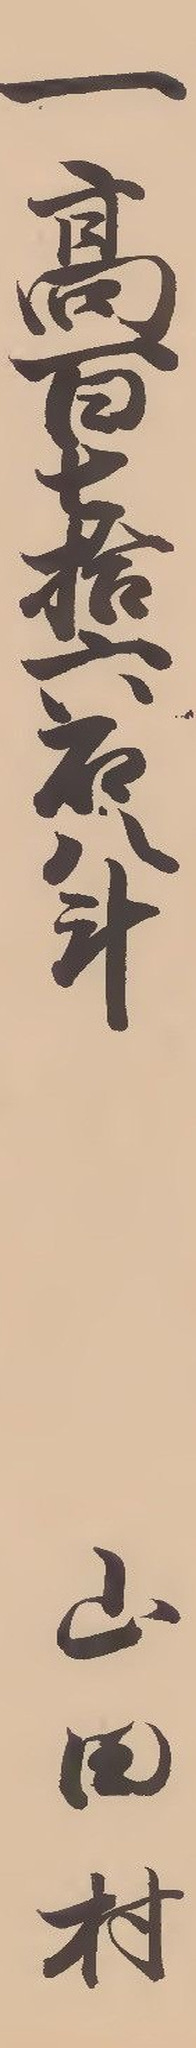一高百七拾六石八斗山田村
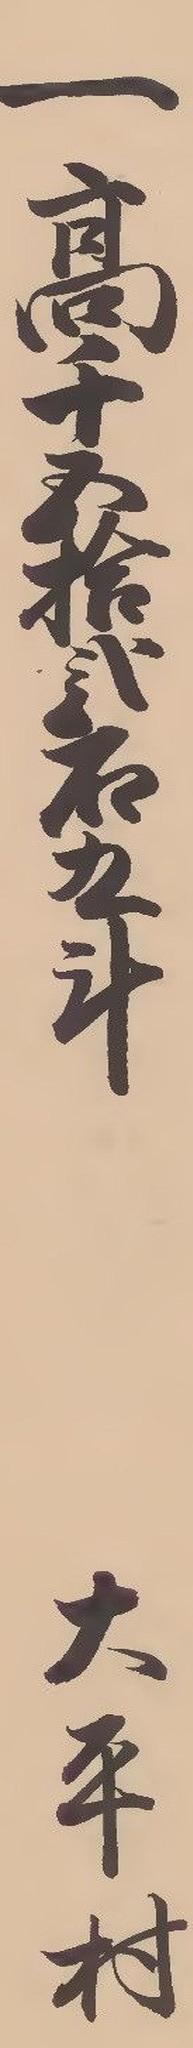一高千五拾弐石九斗大平村

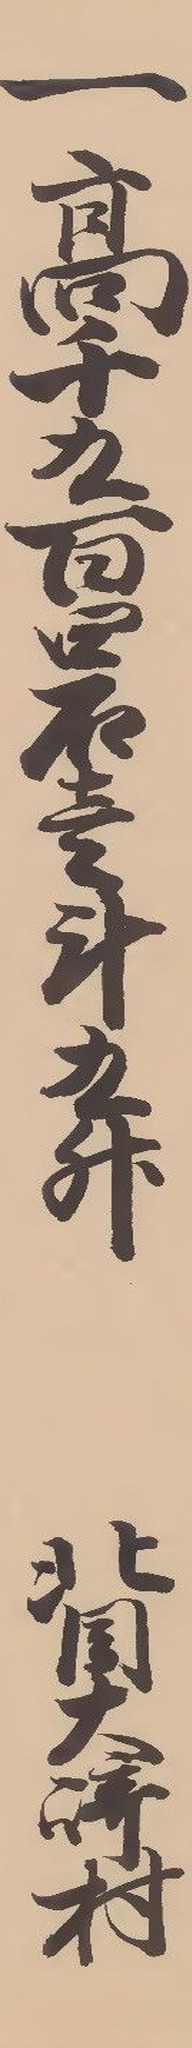一高千九百四石壱斗九升北目大崎村
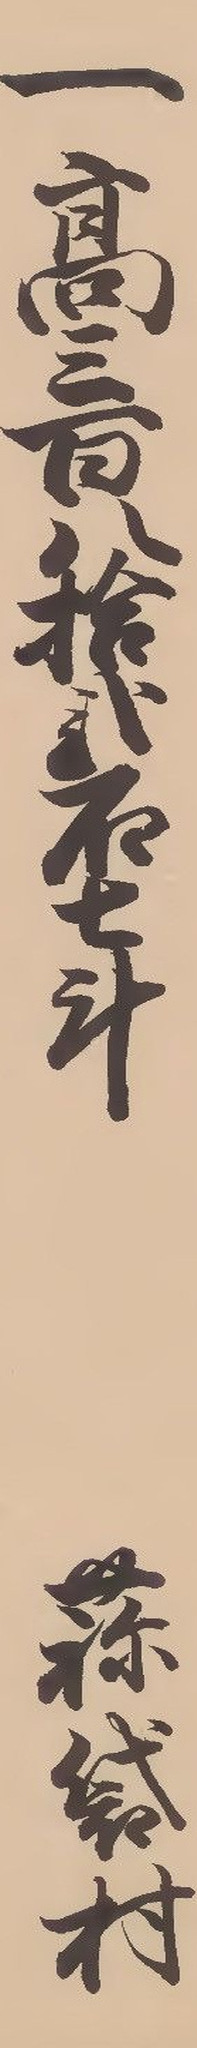一高三百八拾弐石七斗蒜袋村
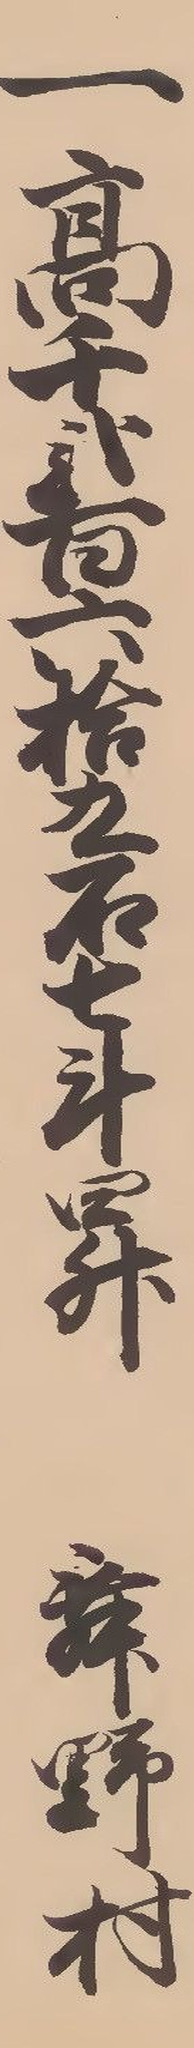一高千弐百六拾九石七斗四升舞野村
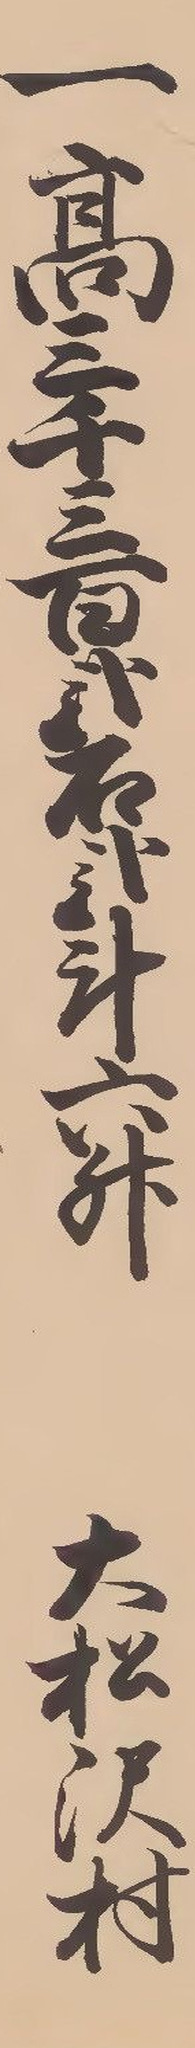一高三千三百弐石弐斗六升大松沢村
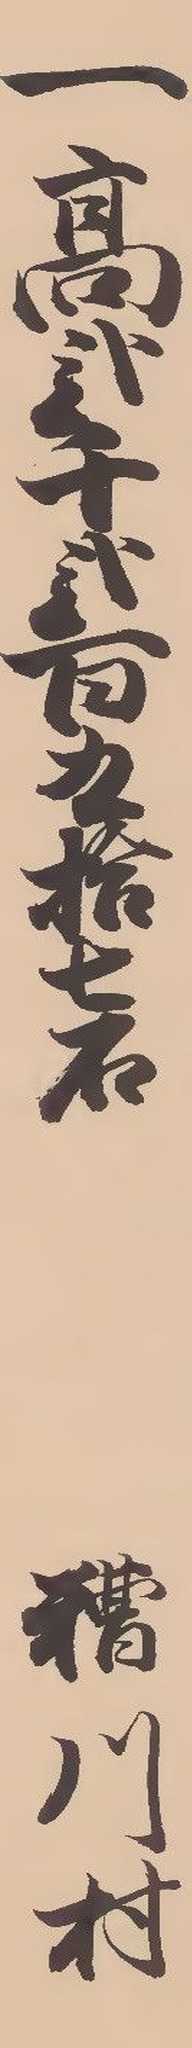一高弐千弐百九拾七石糟川村
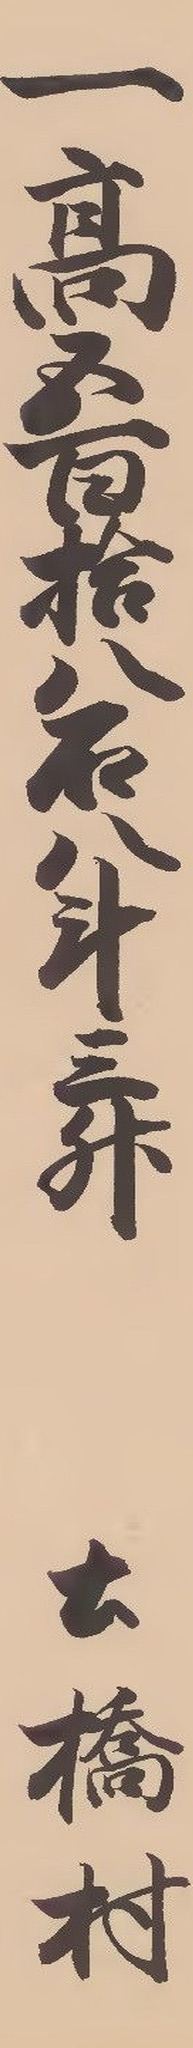一高五百拾八石八斗三升土橋村
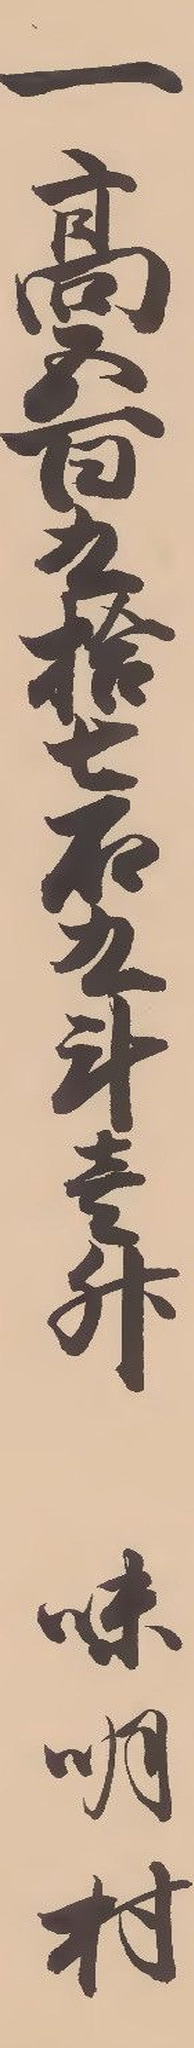一高五百九拾七石九斗壱升味明村
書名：陸奥国郷帳　５
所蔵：国立公文書館 National Archives of Japan
